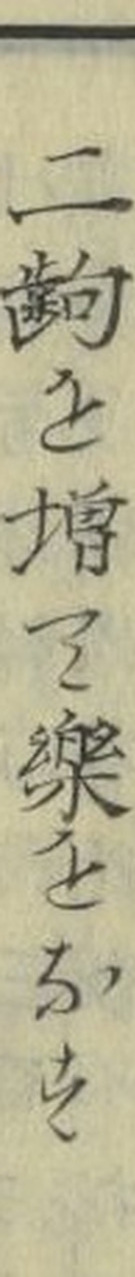二駒を増て楽をなす
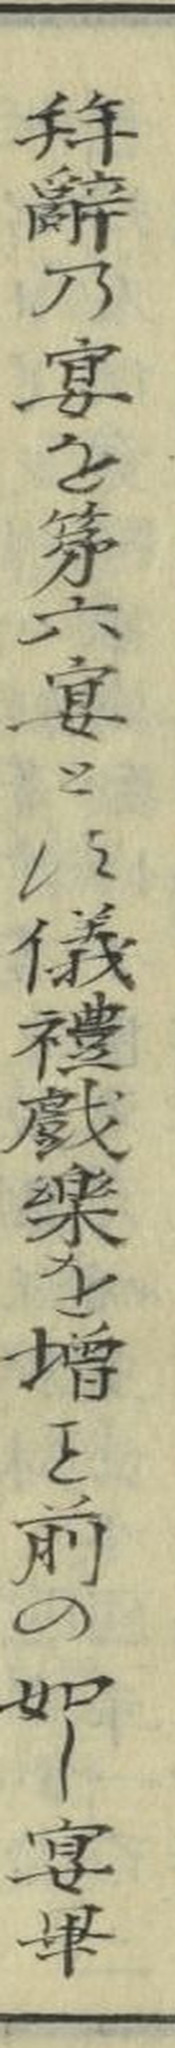拝辞の宴を第六宴とす儀礼戯楽を増こと前の如し宴畢
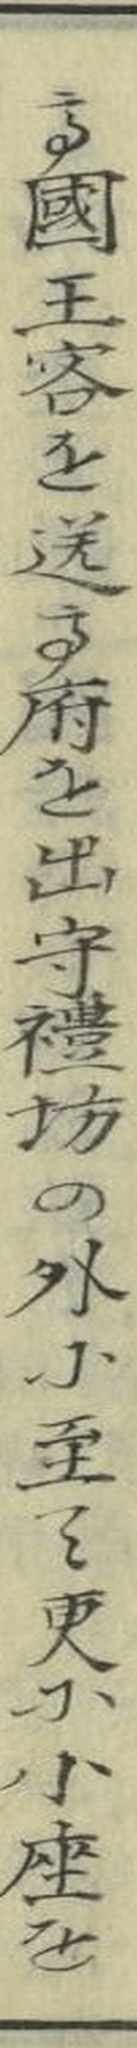て国王客を送て府を出守礼坊の外に至て更に小座を
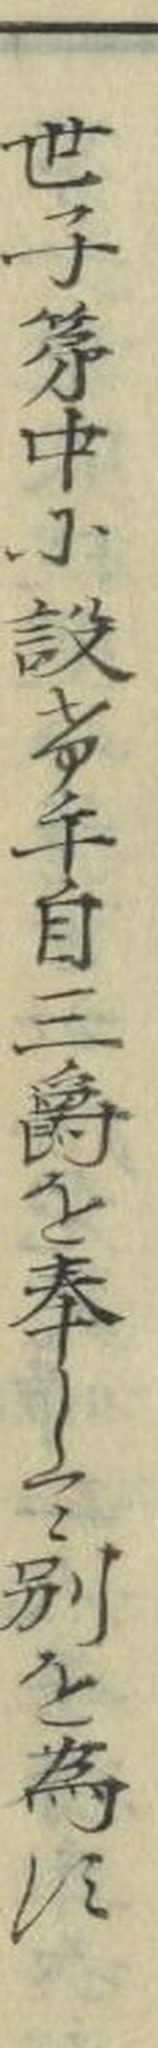世子第中に設け手自三爵を奉して別を為す
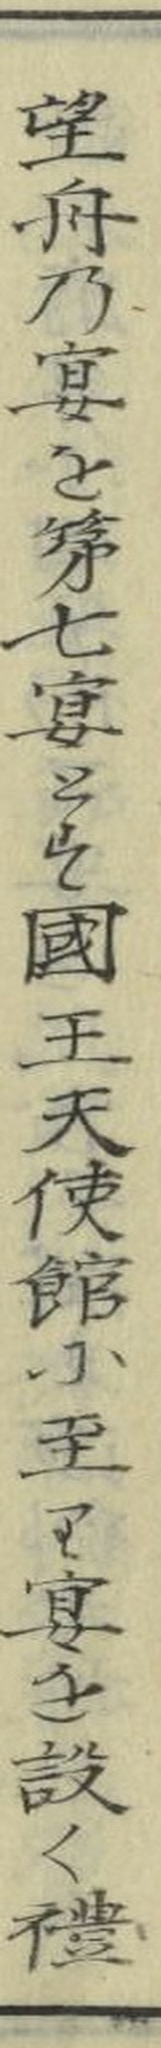望舟の宴を第七宴とす国王天使館に至り宴を設く礼
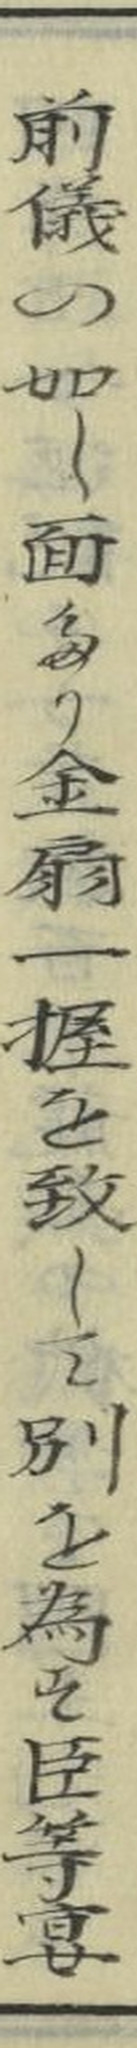前儀の如し面たり金扇一握を致して別を為す臣等宴
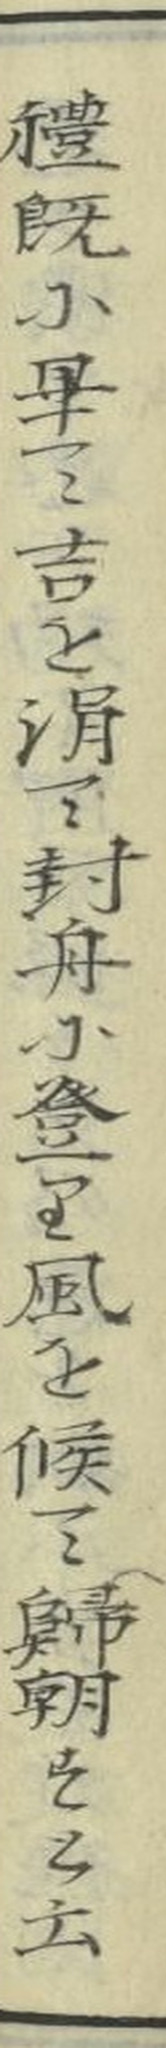礼既に畢て吉を涓て封舟に登り風を候て帰朝すと云
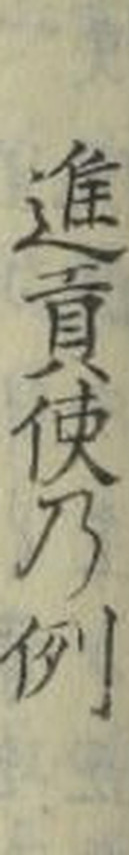進貢使の例
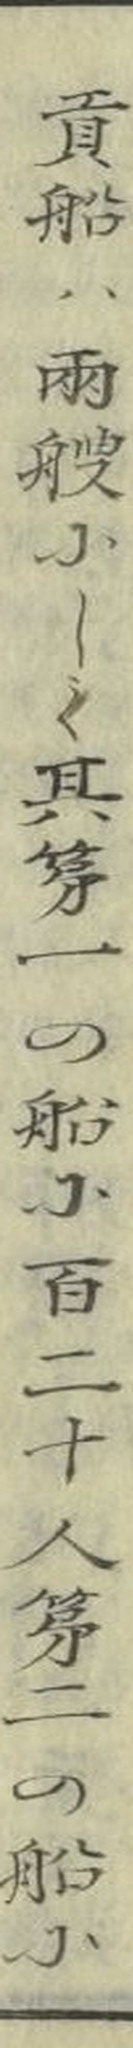貢船は両艘にして其第一の船に百二十人第二の船に

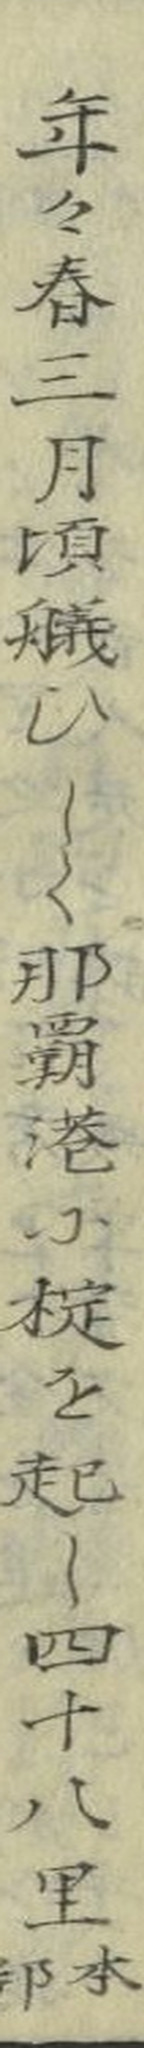年々春三月頃艤ひして那覇港に椗を起し四十八里本邦
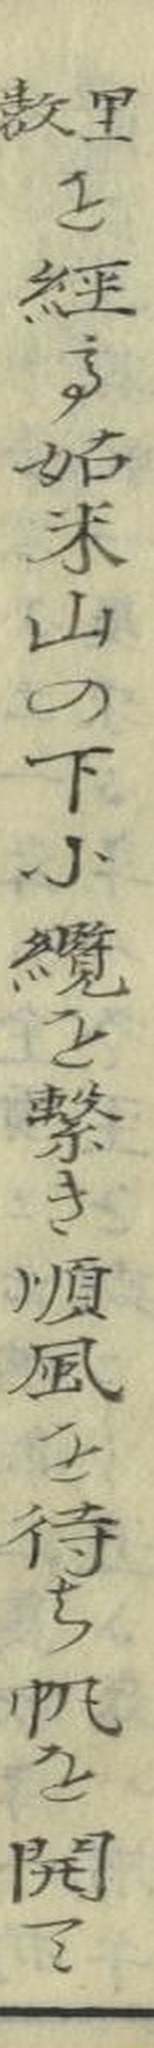里数を経て姑米山の下に纜を繋き順風を待ち帆を開て
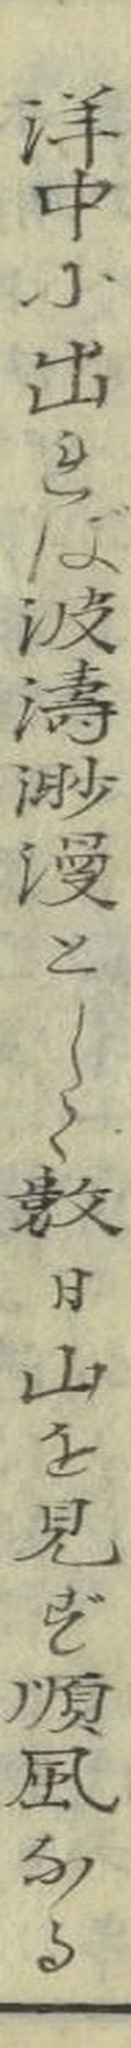洋中に出れば波濤渺漫として数日山を見ず順風なる
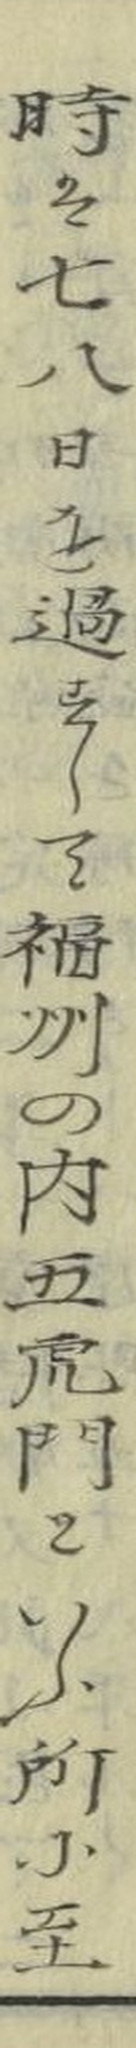時は七八日を過すして福州の内五虎門といふ所に至
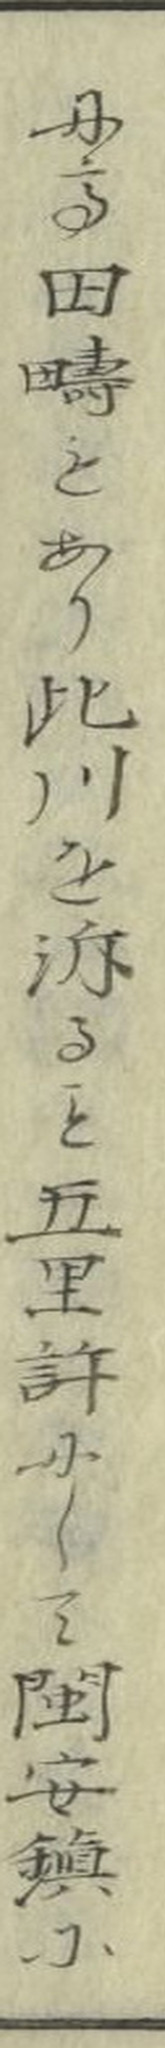にて田疇もあり此川を泝ること五里許にして閩安鎮に
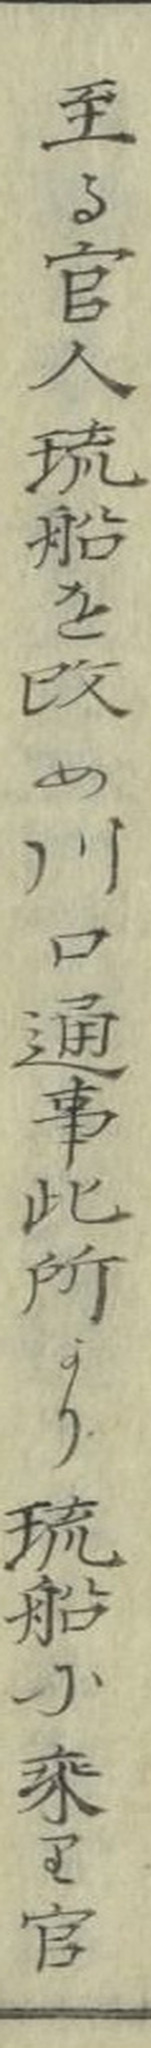至る官人琉船を改め川口通事此所より琉船に乗り官
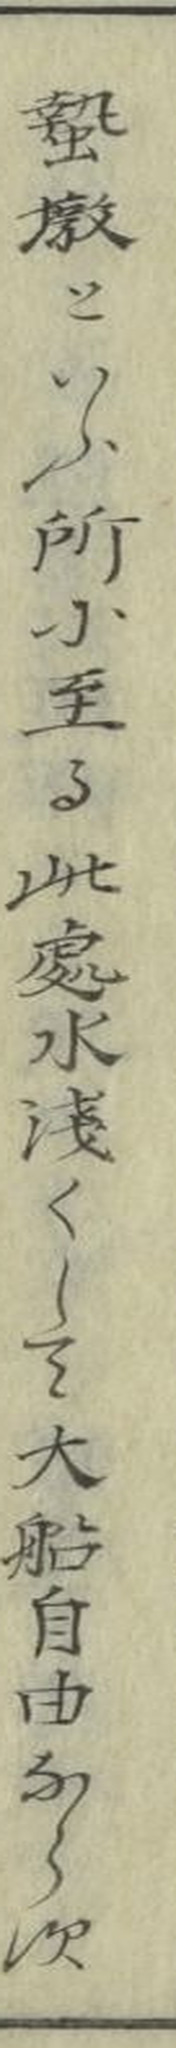蟄墩といふ所に至る此処水浅くして大船自由ならす
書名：琉球沿革志 下
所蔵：University of the Ryukyus Library
